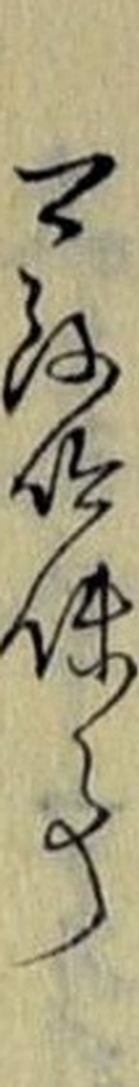可致吟味事
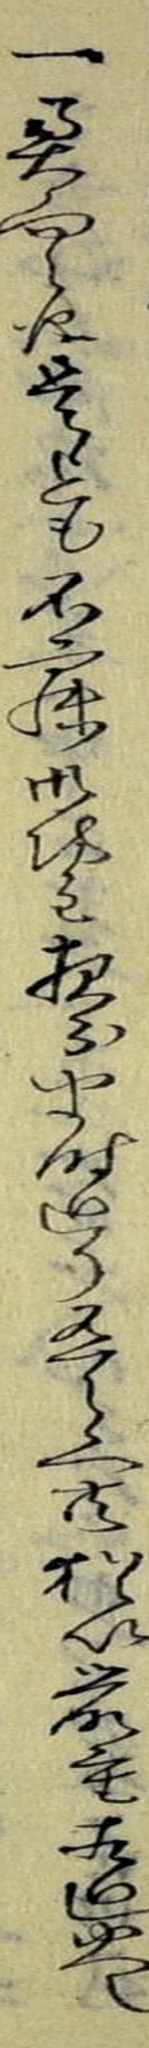一奥向之儀是迄も不寝御坊主夜分半時廻り有之候へ共猶以厳重相廻火之
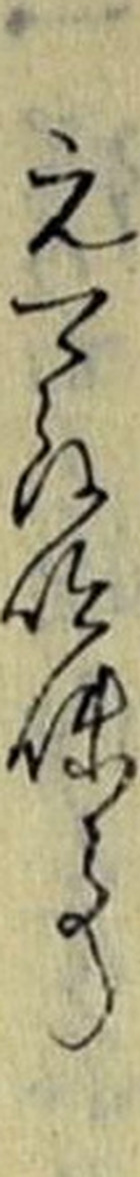元可致吟味事
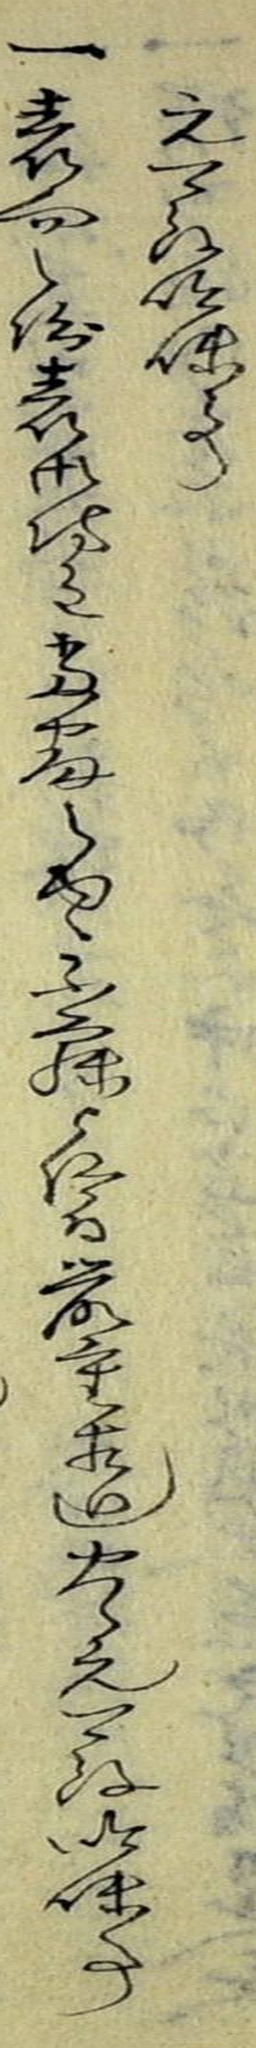一表向之儀表御坊主当番之内へ不寝被仰付厳重相廻火之元可致吟味事
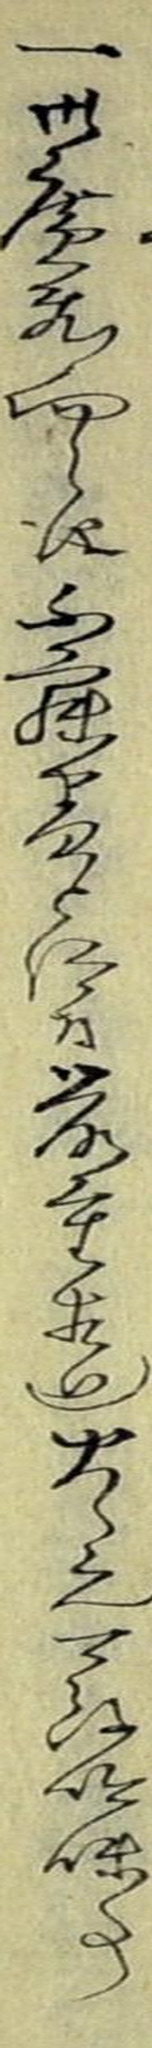一御広敷向之儀不寝番被仰付厳重相廻火之元可致吟味事
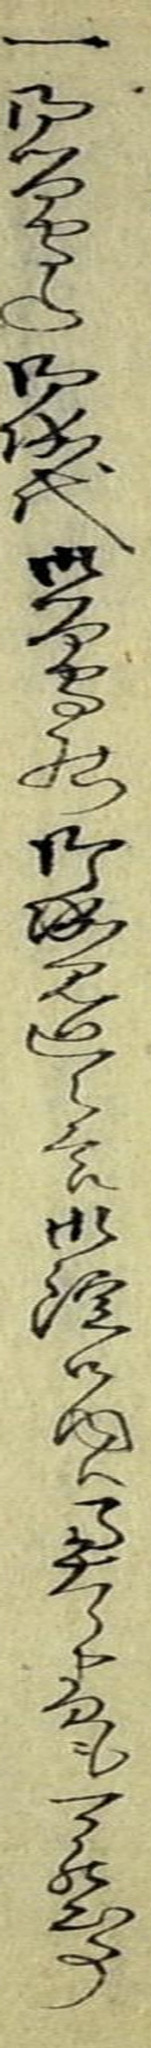一御留守年御城代御留守居御城見廻之節御錠口内ハ奥部屋も可罷出事
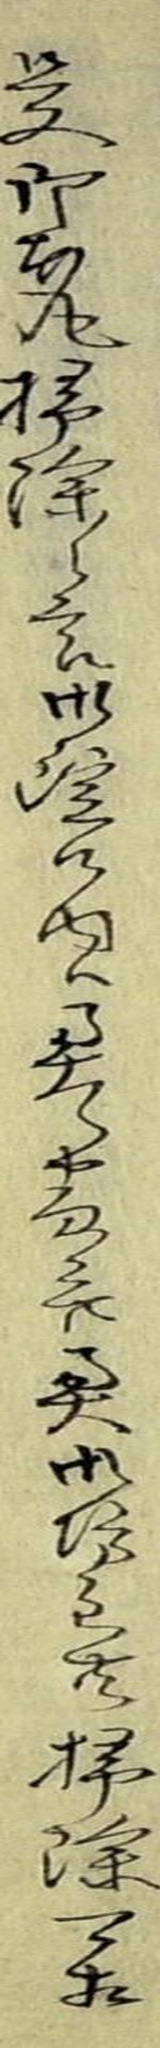且又御本丸掃除之節御錠口内ハ奥番并奥御坊主共掃除可相
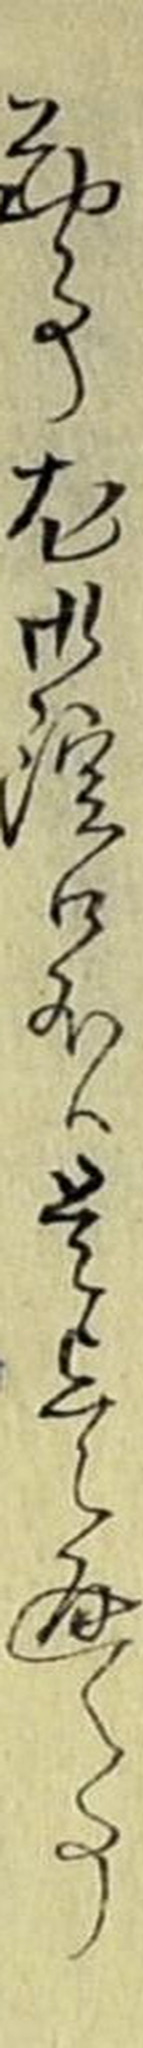勤事尤御錠口外ハ是迄之通之事
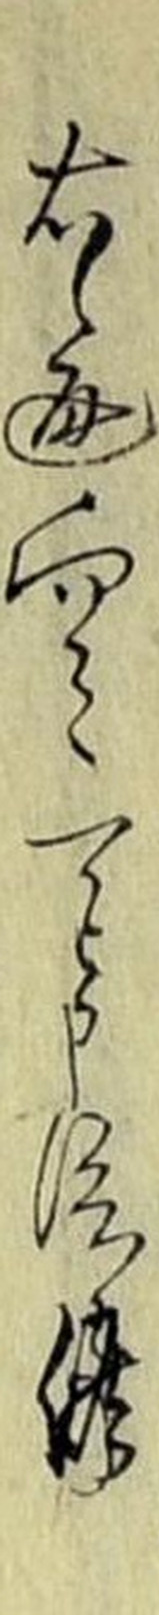右之通向々へ可被申渡候
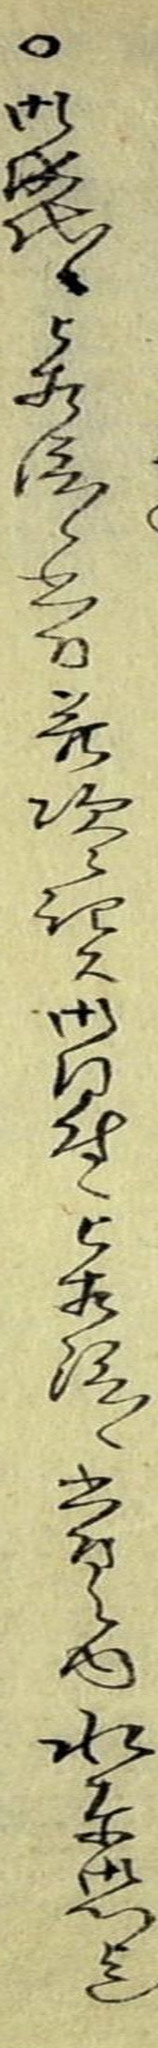○御城代へ被相渡候書付并次ニ記ス御目付へ被相渡候書付之内水車御門迄
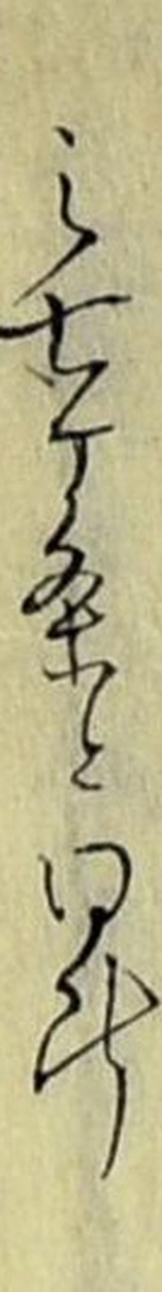之七ケ条ニ同断
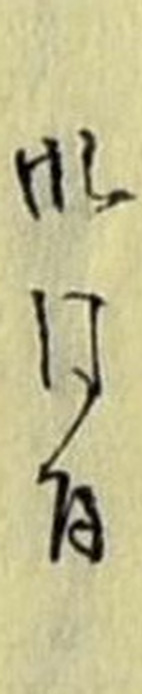御目付
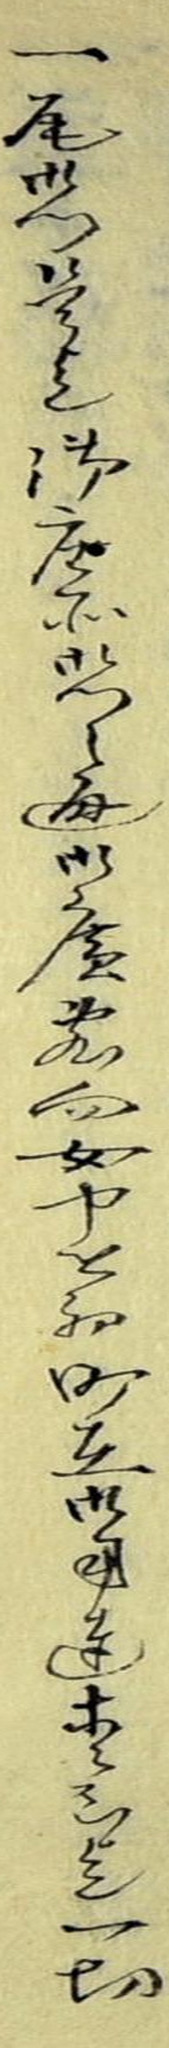一瓦御門是迄御座所御門之通御広敷向女中を初町在御用達等ニ至迄一切

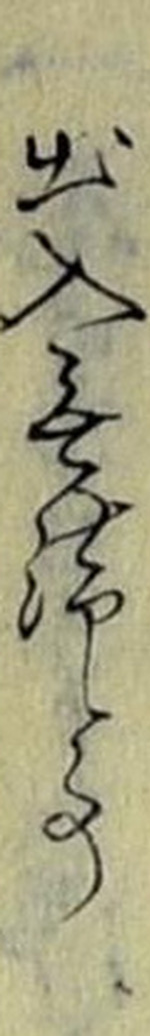出入無滞候事
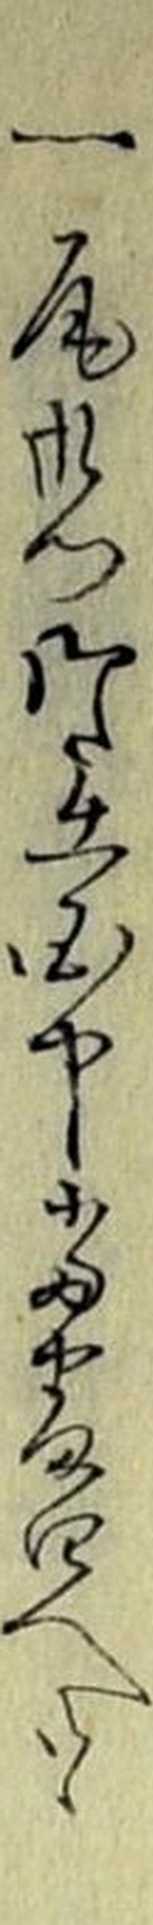一瓦御門御在国中当番四人ツヽ
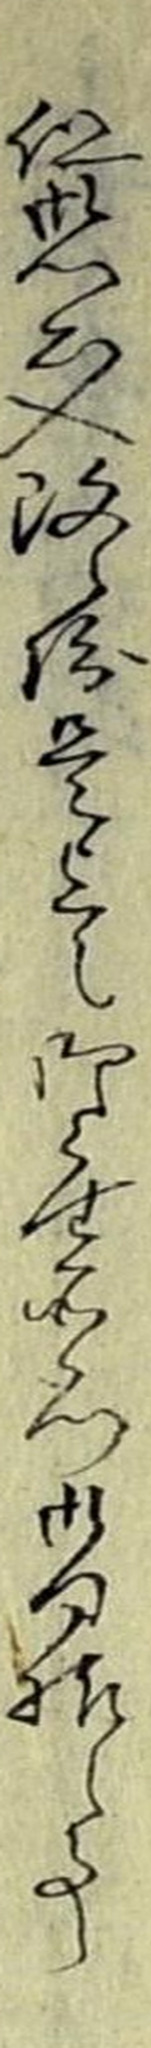但御門出入改之儀是迄之御座所御門御同様之事
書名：命令之部 五
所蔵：福井県文書館 Fukui Prefectural Archives
